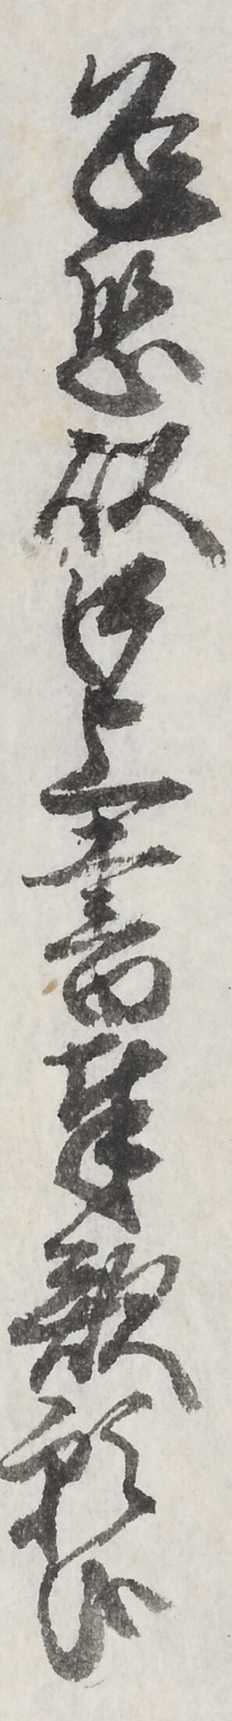乍恐以口上書奉歎願候
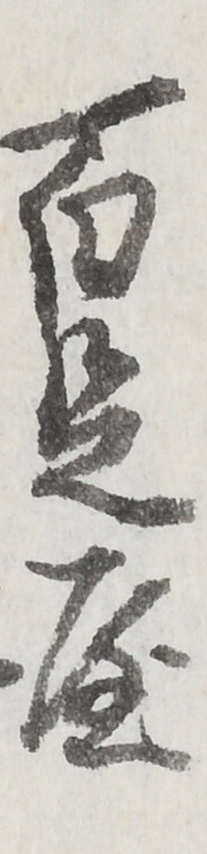百足屋
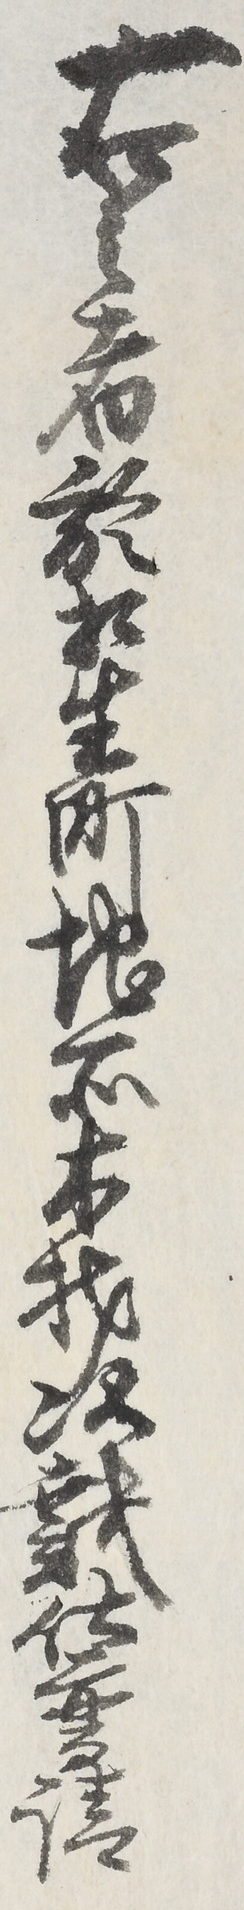右之者於相生町地所木材頂戴仕普請
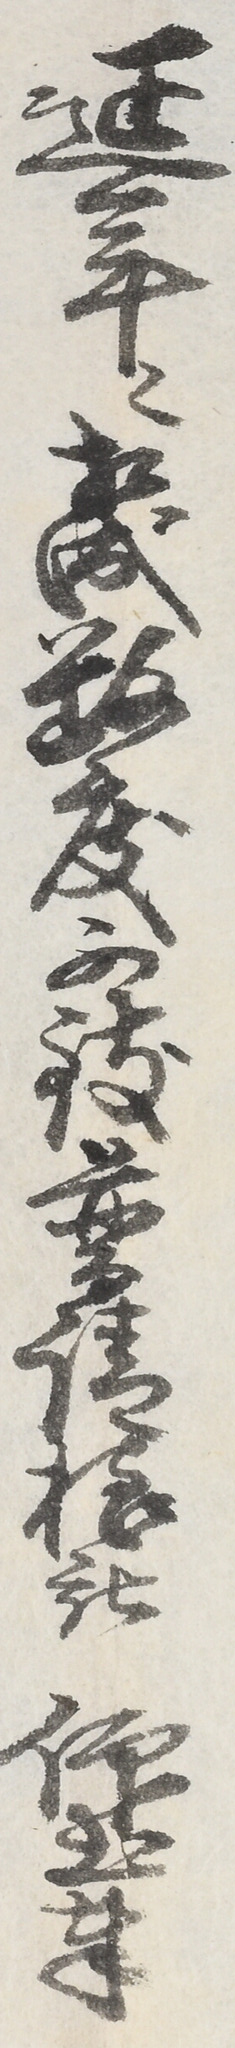延年ニ相成数度不致普請様被仰出奉
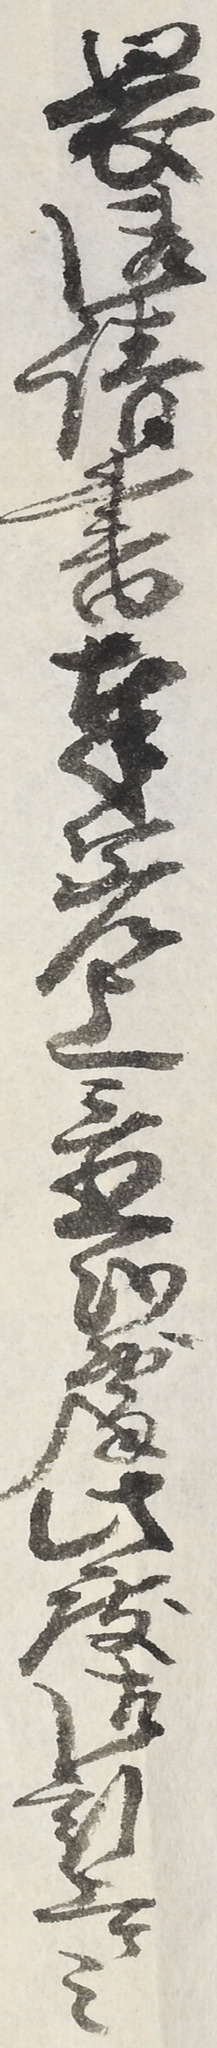畏御請書奉差上置候処此度御引上ケ之
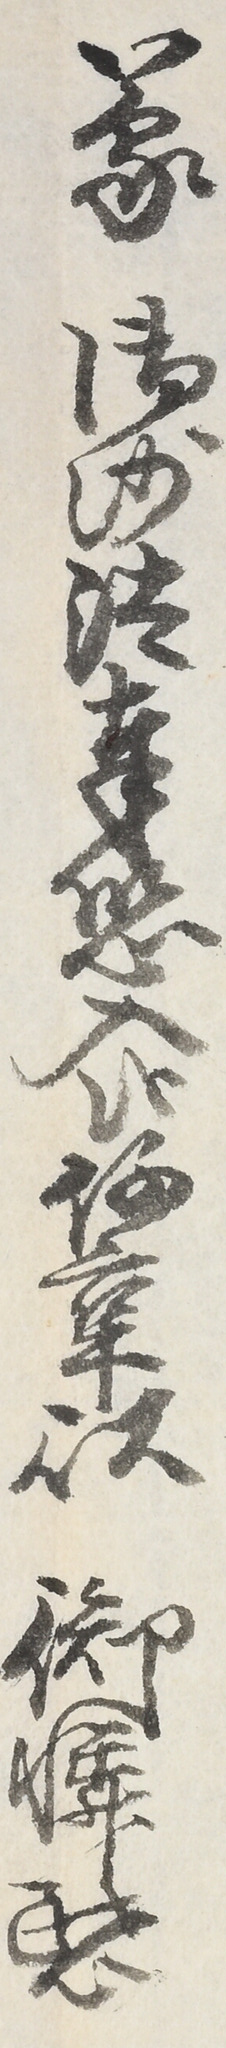蒙御沙汰奉恐入候何卒以御憐愍
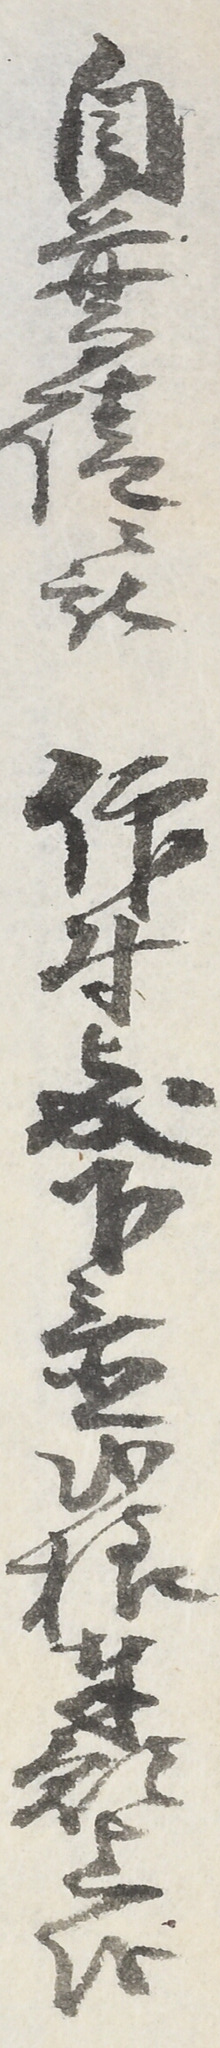自普請ニ被仰付被成下候様奉願上候
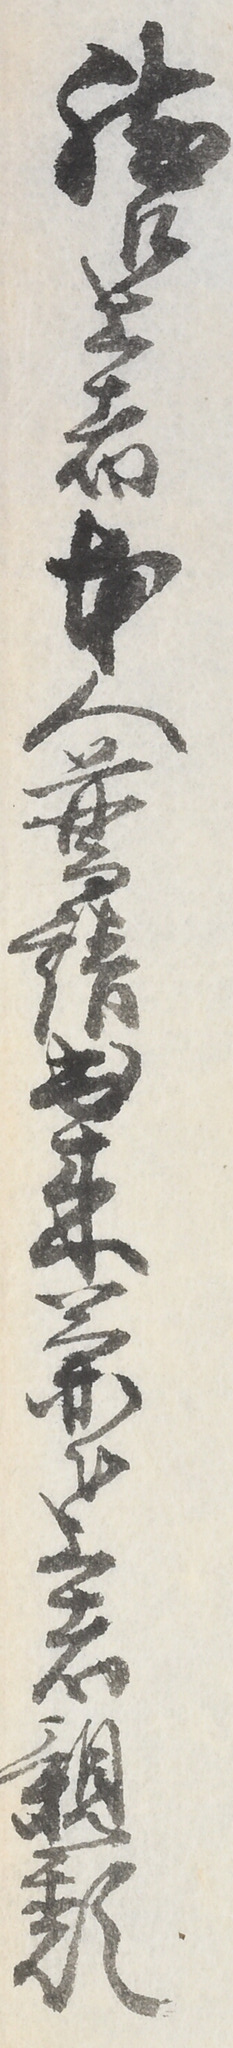然ル上者本人普請出来兼候上者親類
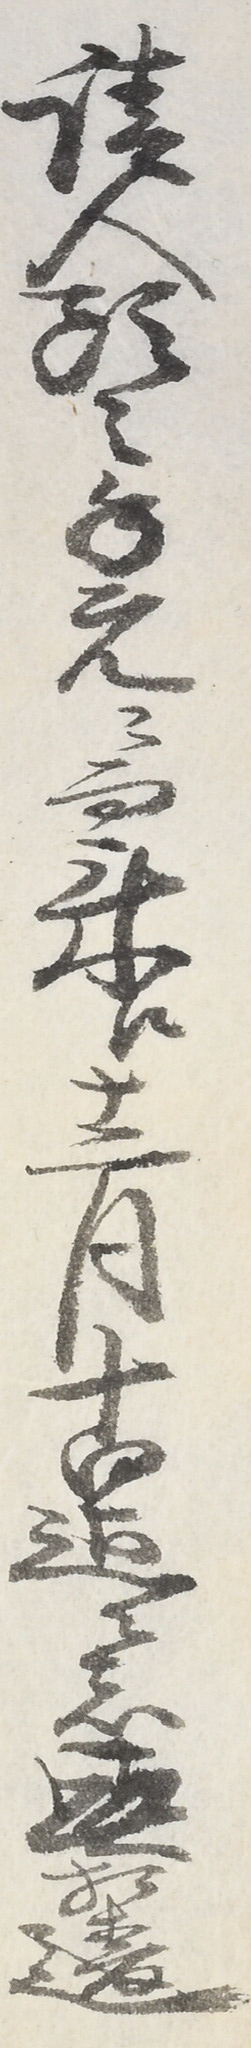請人頭之手元ニ而来ル十二月十日迄ニ者無相違
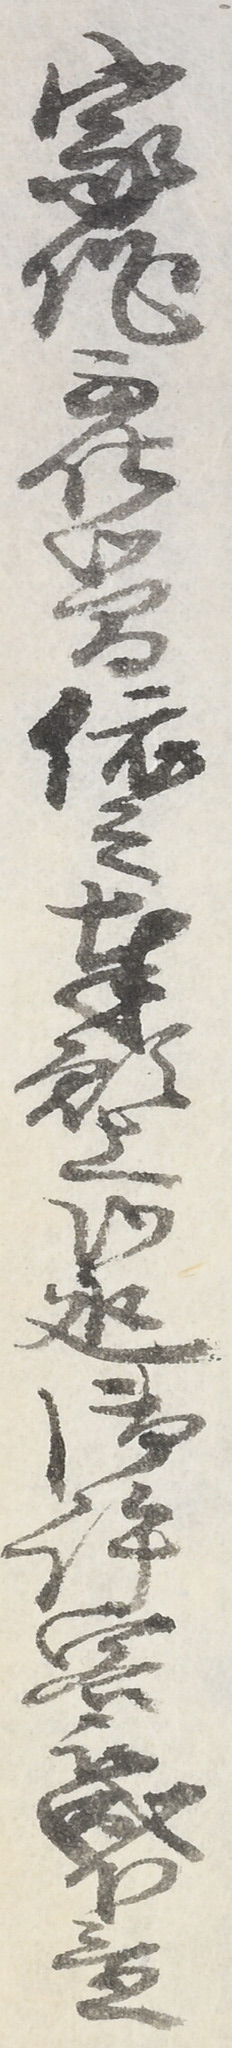家作不仕候間依之奉願上候処御許容被成下置
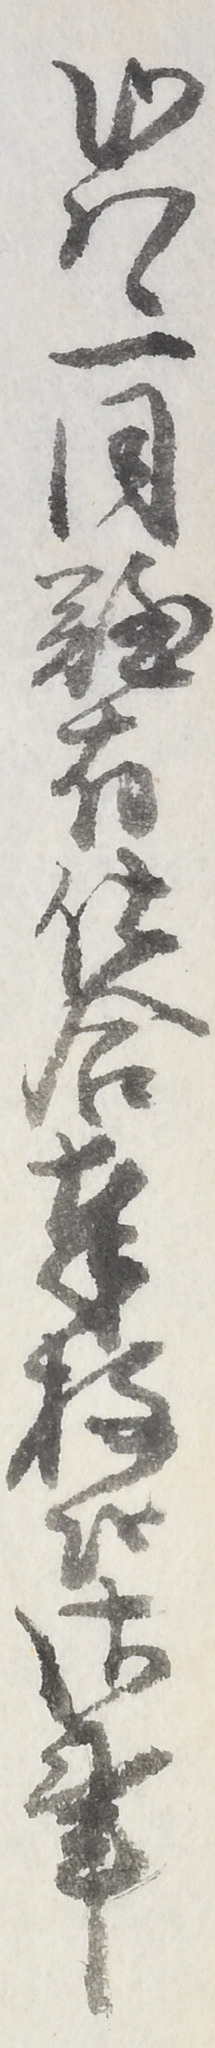候ハゝ一同難有仕合奉存候御事
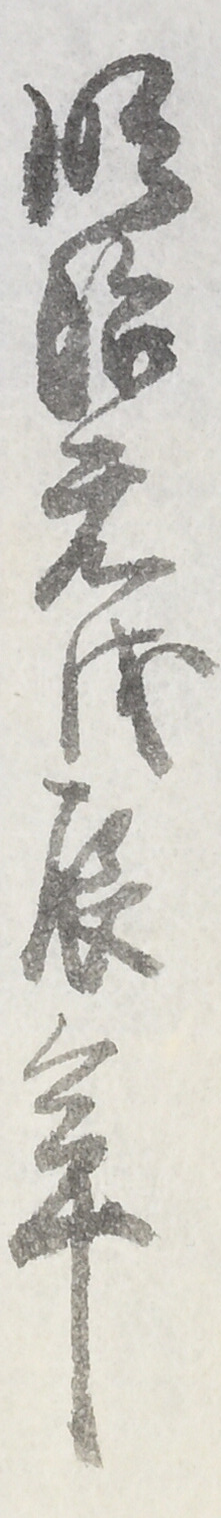明治元戊辰年
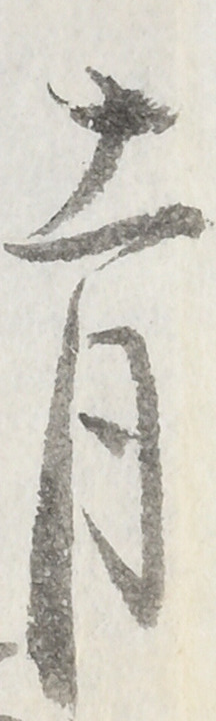十一月
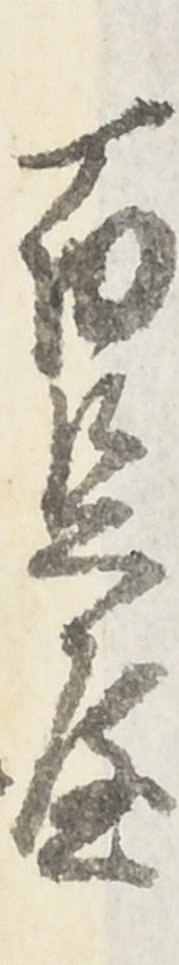百足屋
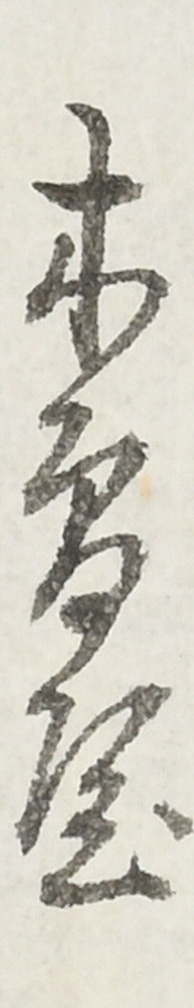木曽屋
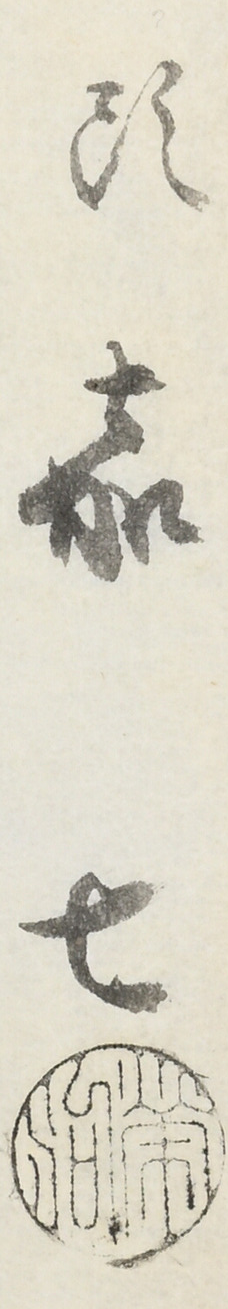頭嘉七㊞
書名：乍恐以口上書奉嘆願候
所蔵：伊那市立高遠町図書館・合同会社AMANE
